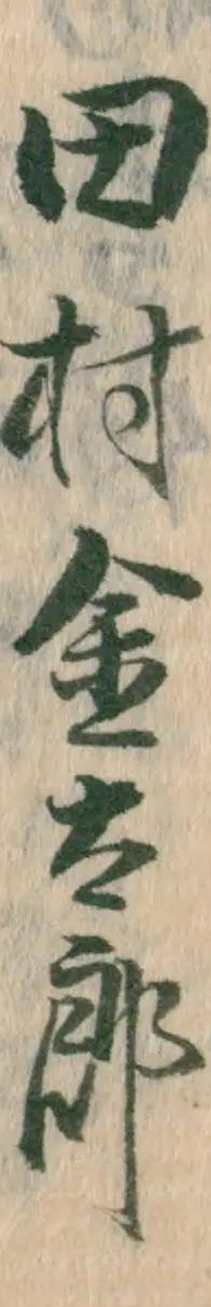田村金太郎
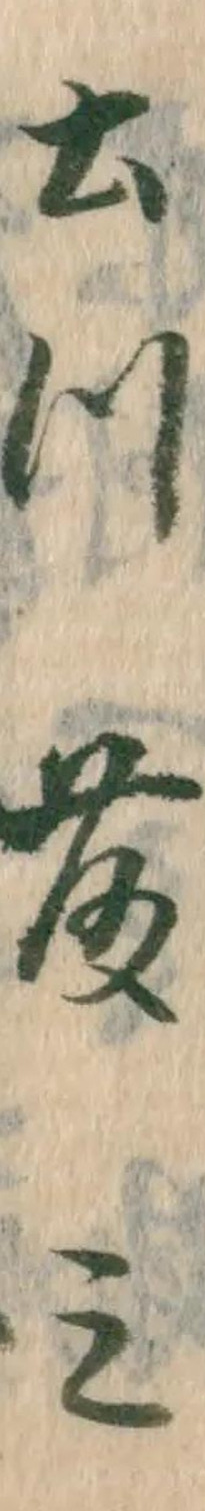出川藤三
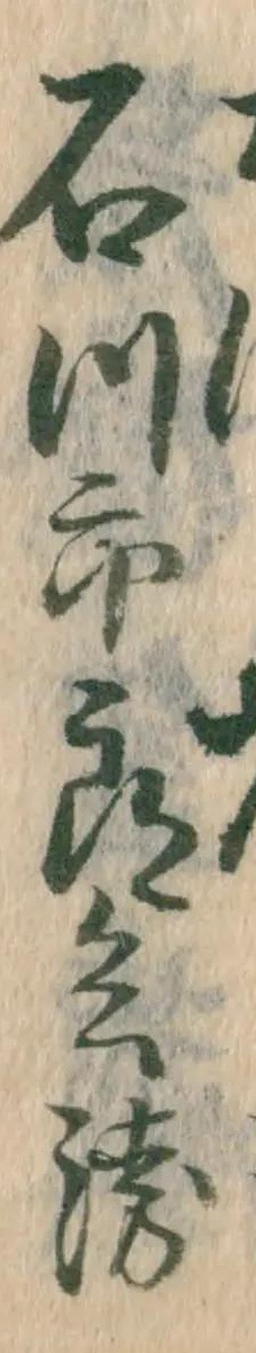石川市郎兵衛

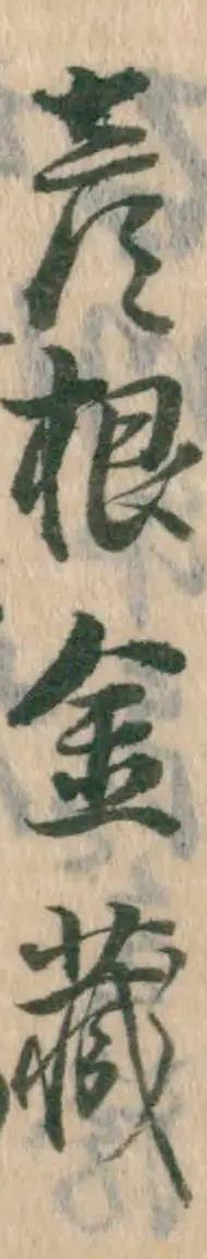彦根金蔵
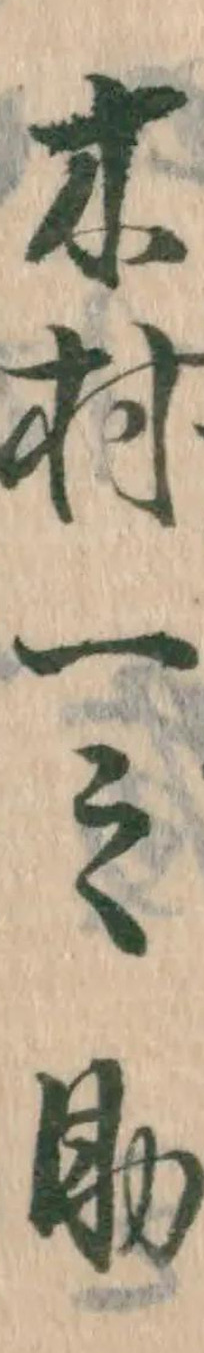木村一之助
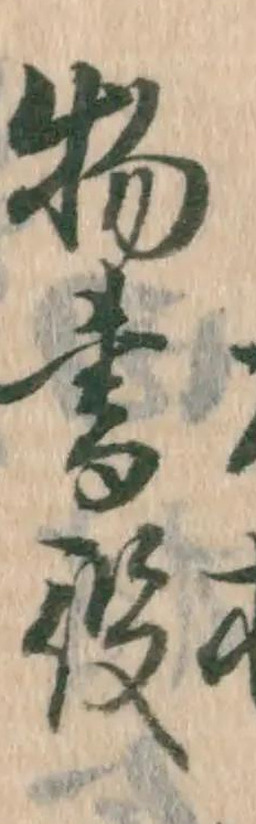物書役
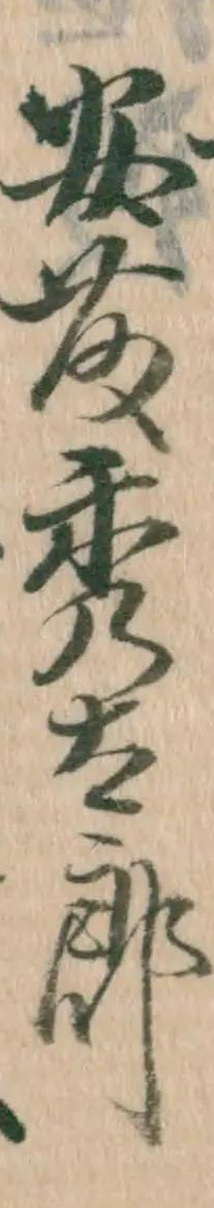安藤秀太郎
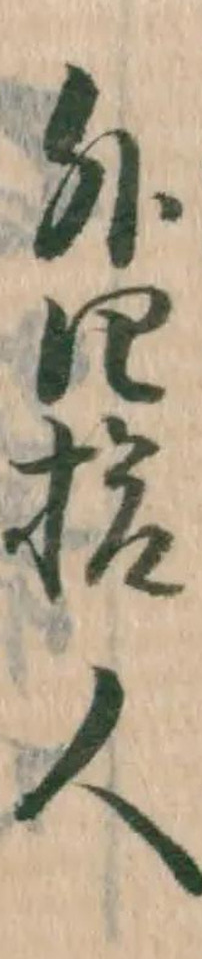外四拾人
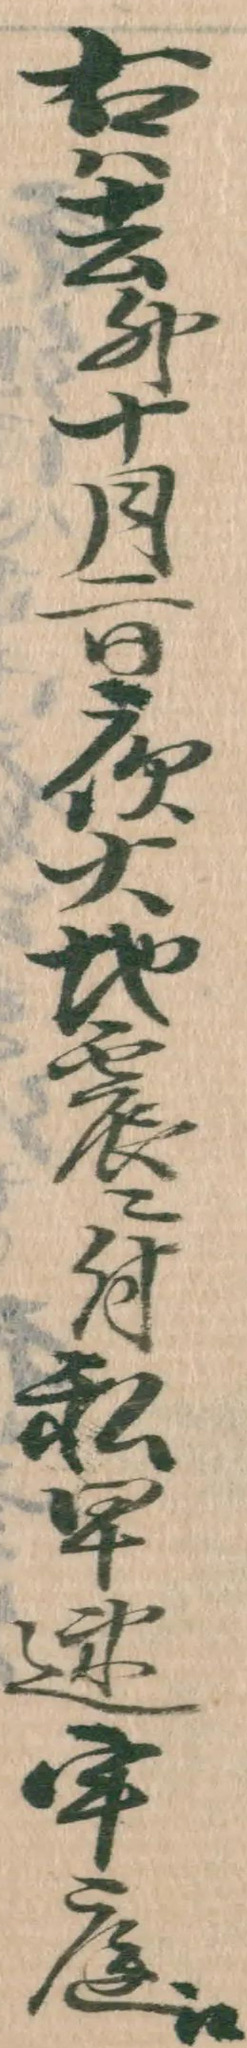右ハ去卯十月二日夜大地震ニ付私早速牢庭え
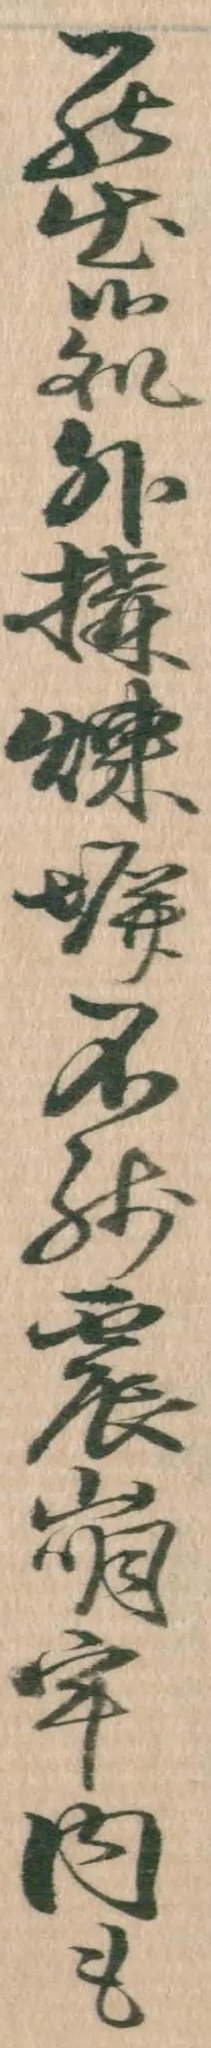罷出候処外構煉塀不残震崩牢内も
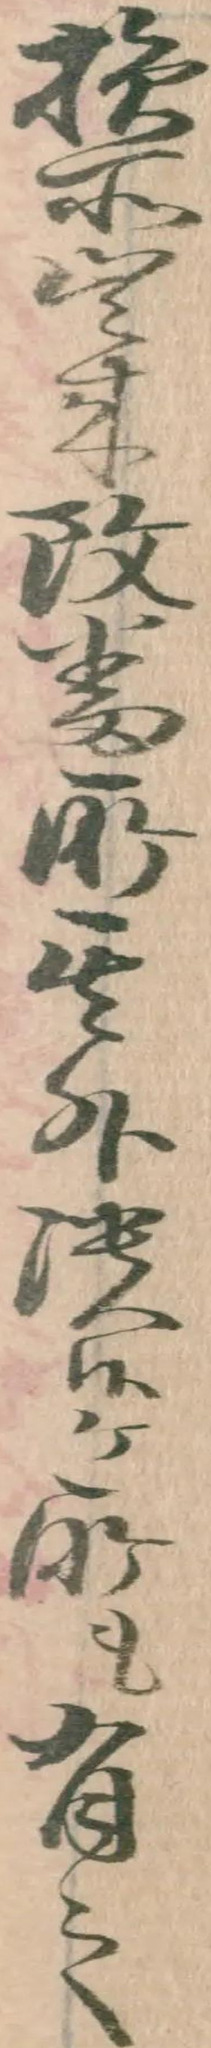損所出来改番所其外潰候ケ所も有之
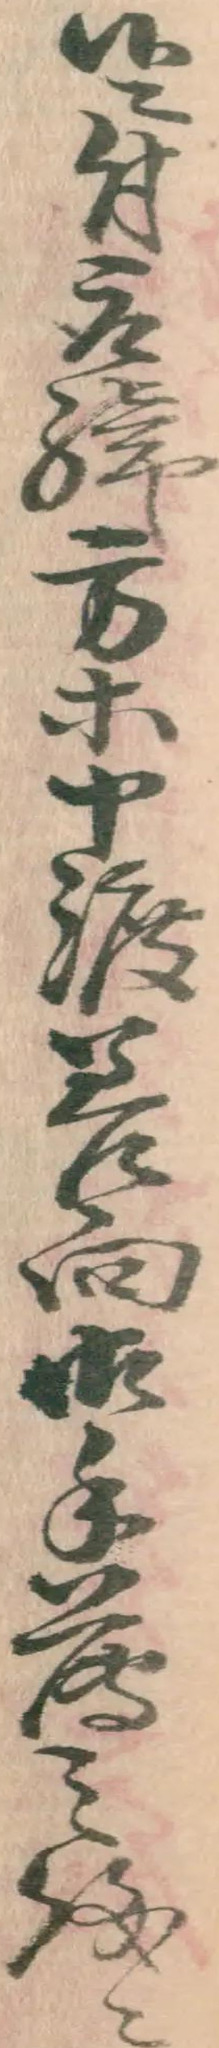候ニ付取締方等申渡差向御手薄之儀ニ
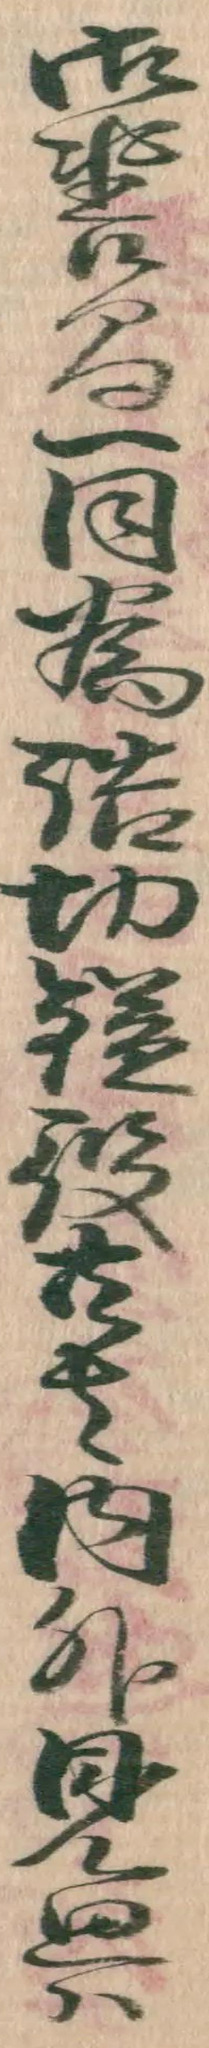御坐候間一同為詰切鎰役共は内外見見廻ハ
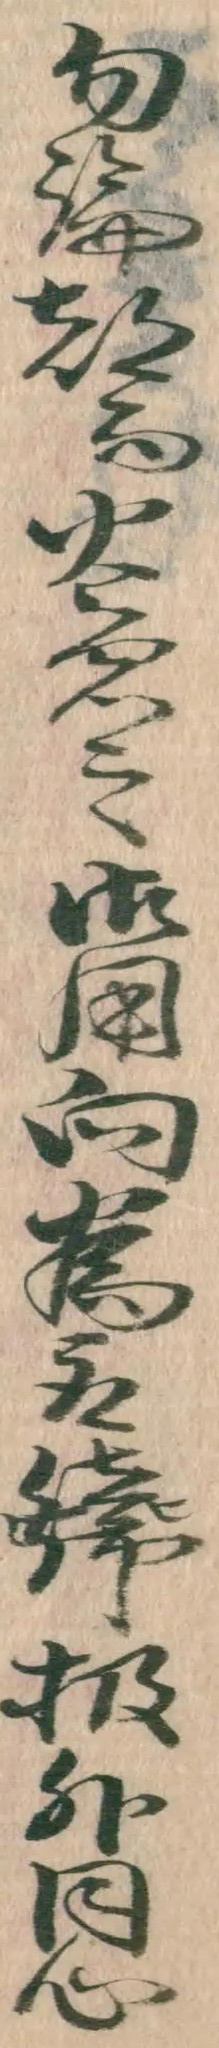勿論都て火急之御用向為取締扱外同心
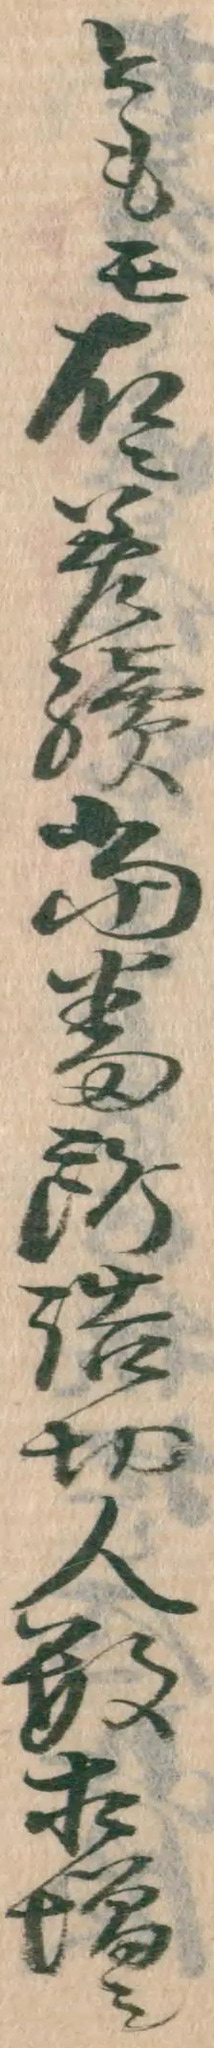ともモ右ニ差続当番所詰切人数相増シ
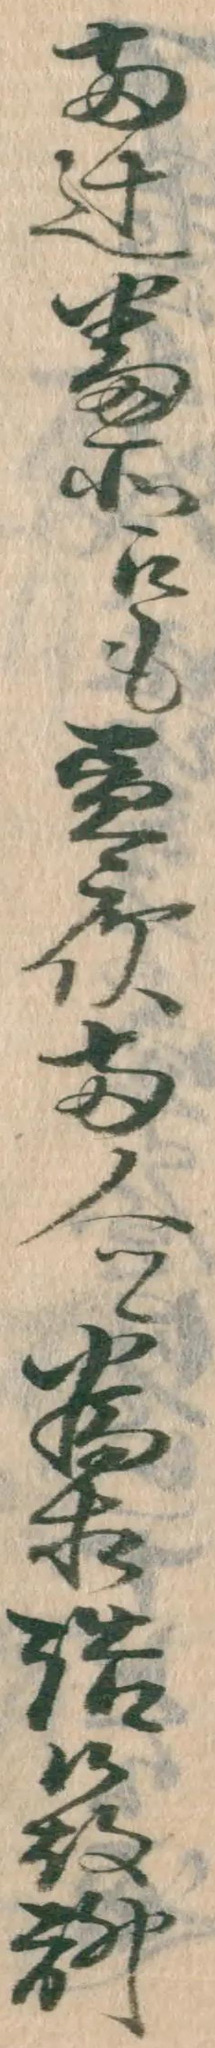両辻番所えも壱夜両人ツヽ為相詰候故聊
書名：七十冊物類集 71巻. [44] 四十三 牢屋敷御普請御修覆地震ニ付骨折候牢屋掛御褒美之部
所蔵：国立国会図書館 National Diet Library, JAPAN
